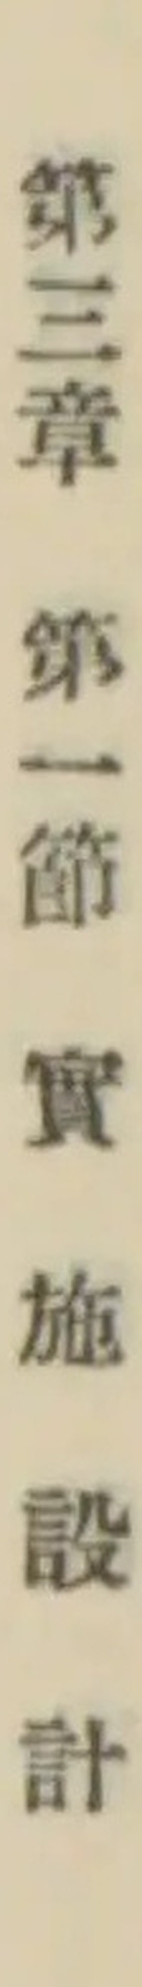第三章第一節実施設計
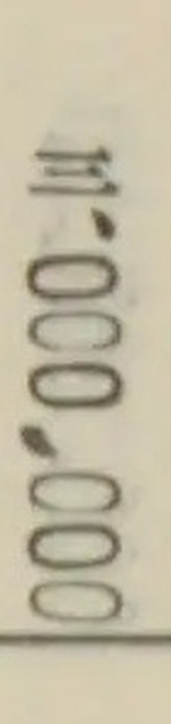計四、八〇〇、〇〇〇
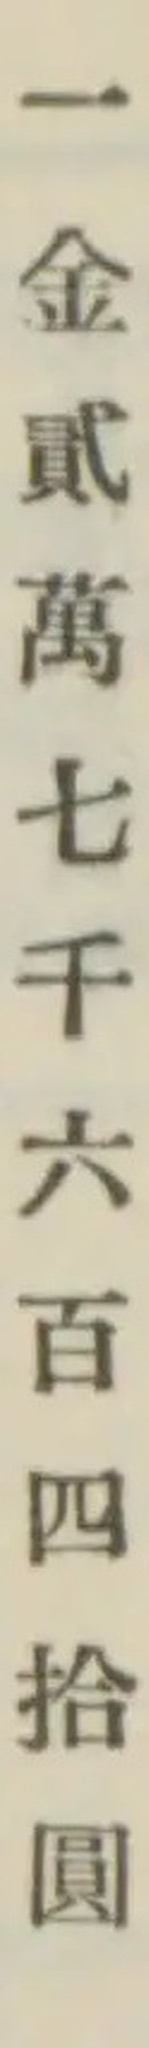一金貳萬七千六百四拾圓
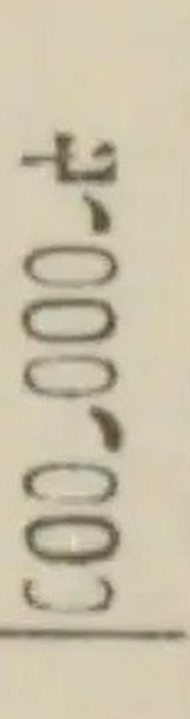計四、八〇〇、〇〇〇
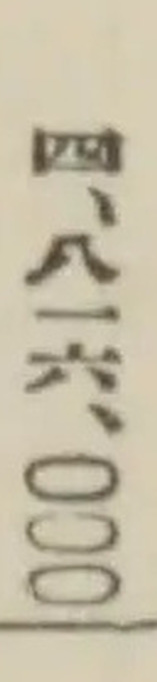計四、八〇〇、〇〇〇
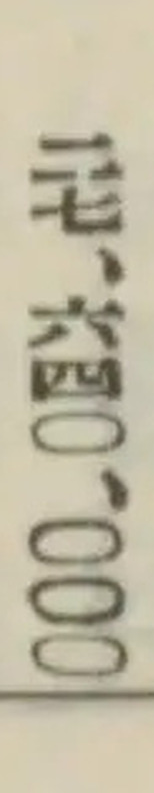計二七、六四〇、〇〇〇
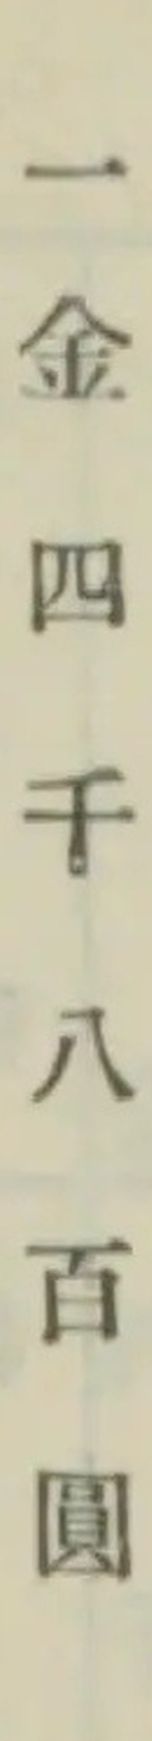一金四千八百圓
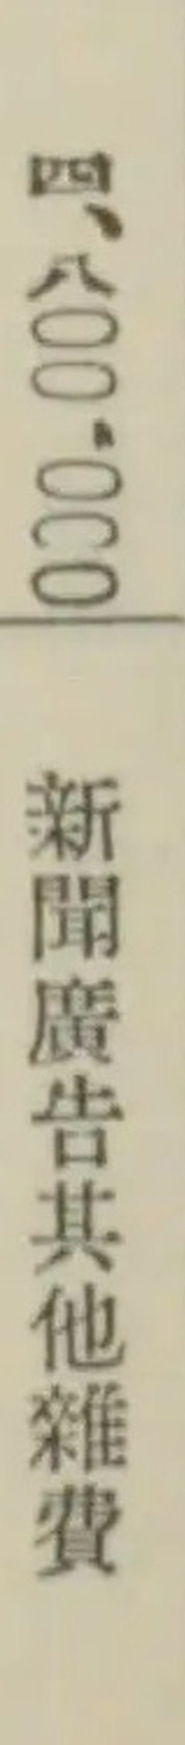雑費四、八〇〇、〇〇〇新聞広告其他雑費
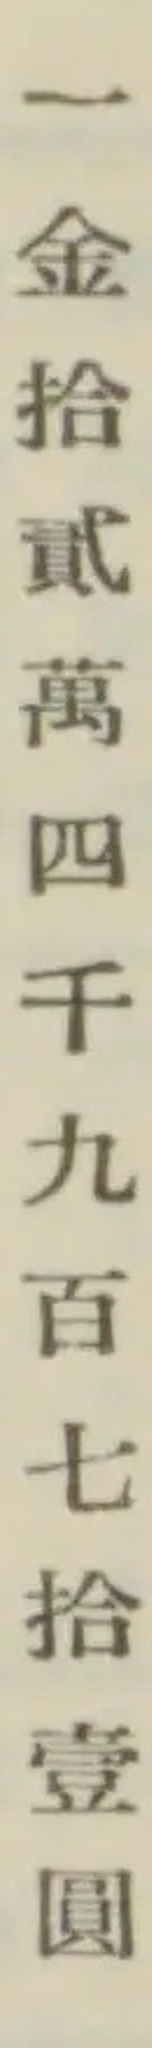一金拾貳萬四千九百七拾壹圓
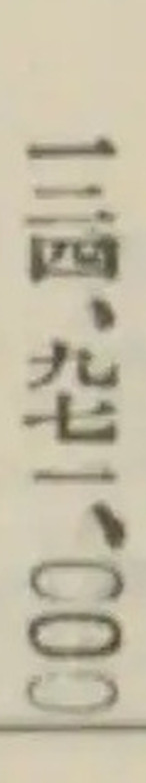計一二四、九七一、〇〇〇
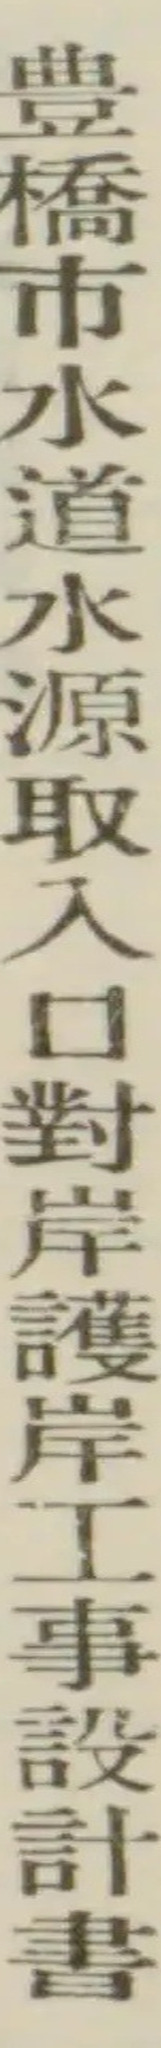豊橋市水道水源取水口対岸護岸工事設計書
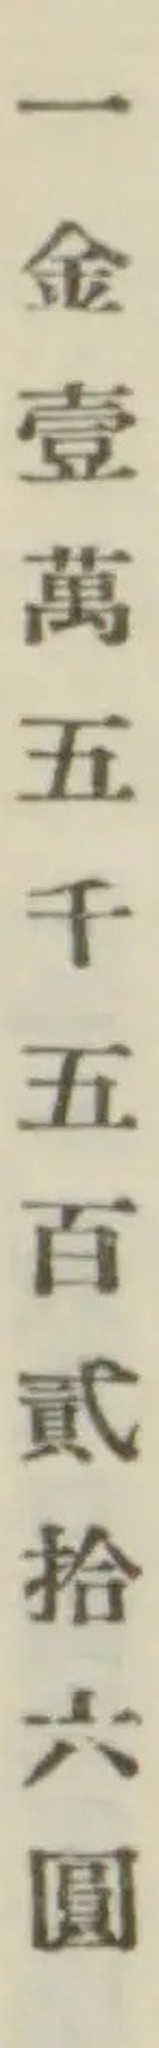一金壹萬五千五百貳拾六圓
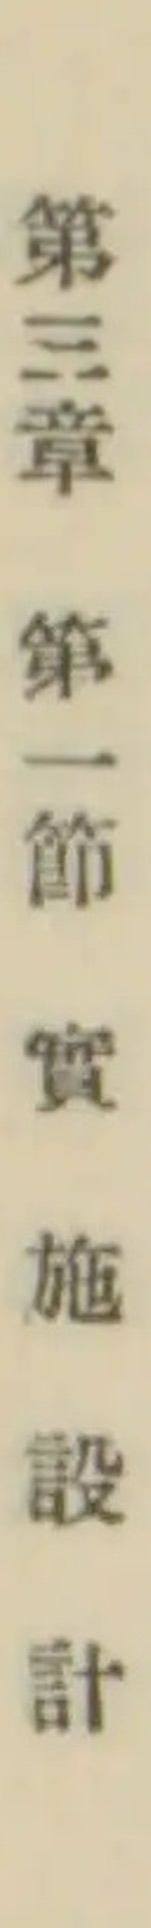第三章第一節実施設計

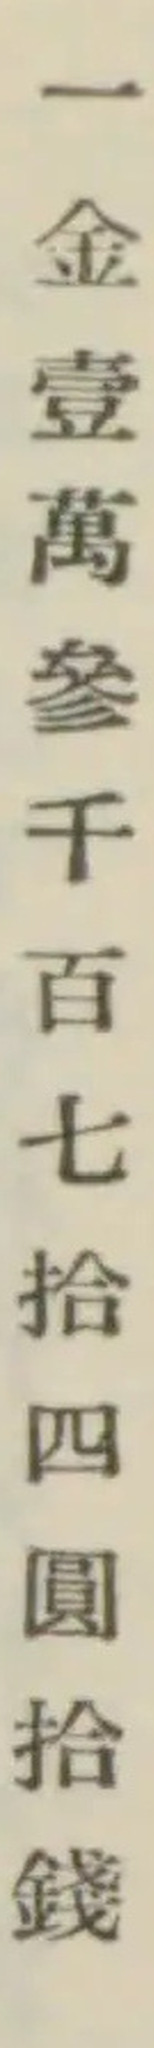一金壹萬參千百七拾四圓拾銭
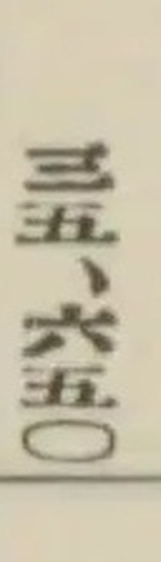計三五、六五〇
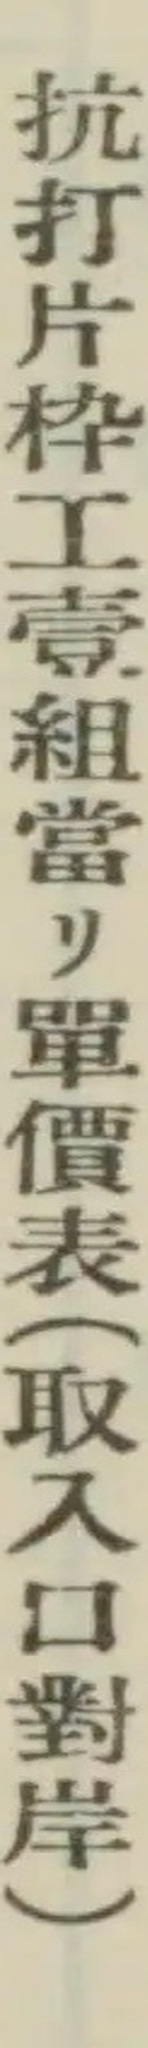杭打片枠工壹組当り単価表(取入口対岸)
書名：豊橋市水道誌
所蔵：国立国会図書館 National Diet Library, JAPAN
